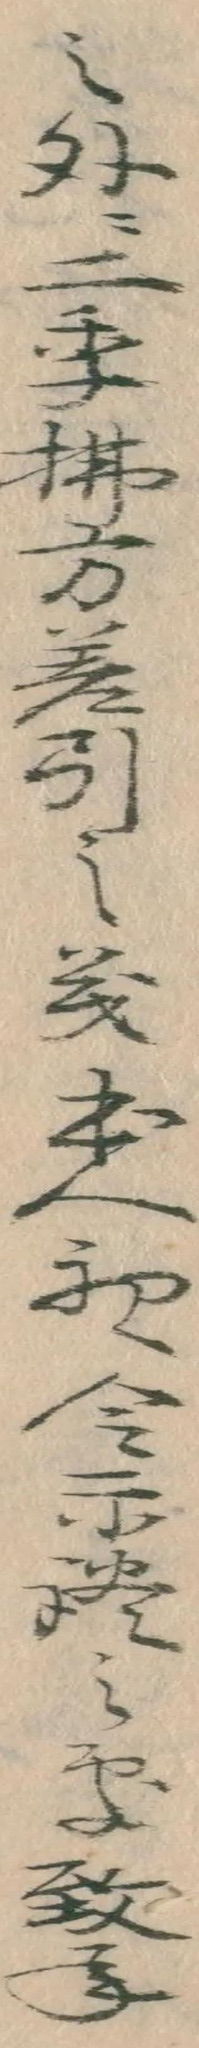之外ニ二季拂払方差引之義本人初へ令示談之處致承
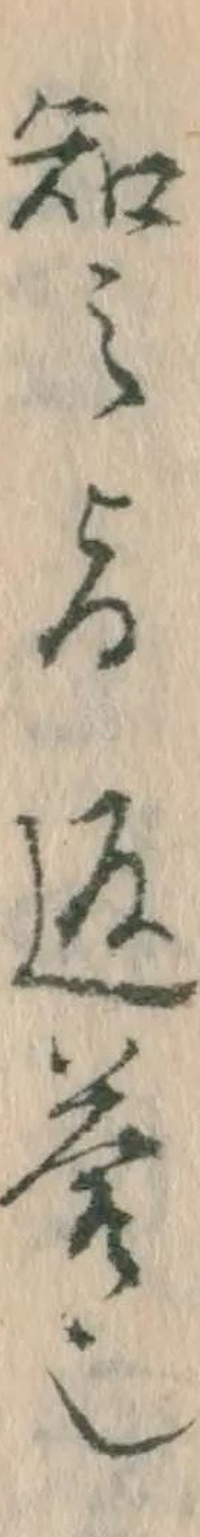知之旨返答也
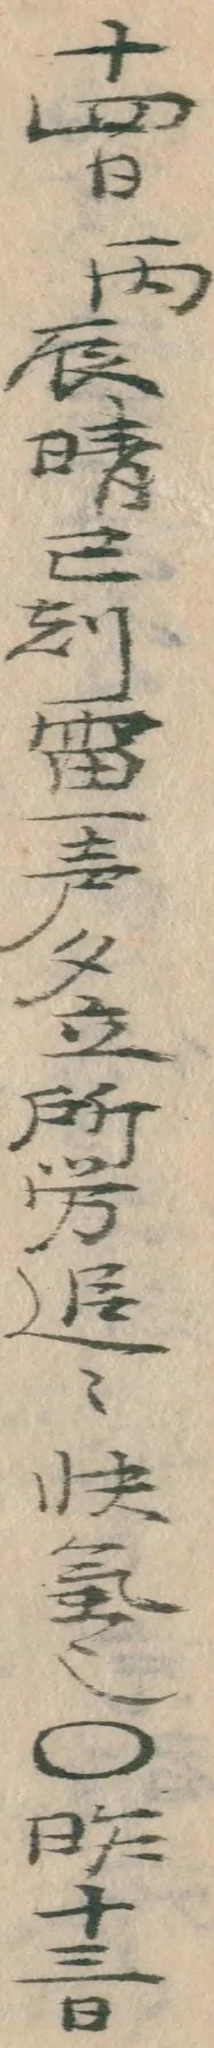十四日丙辰晴巳刻雷一声夕立所労追〻快氣也○昨十三日
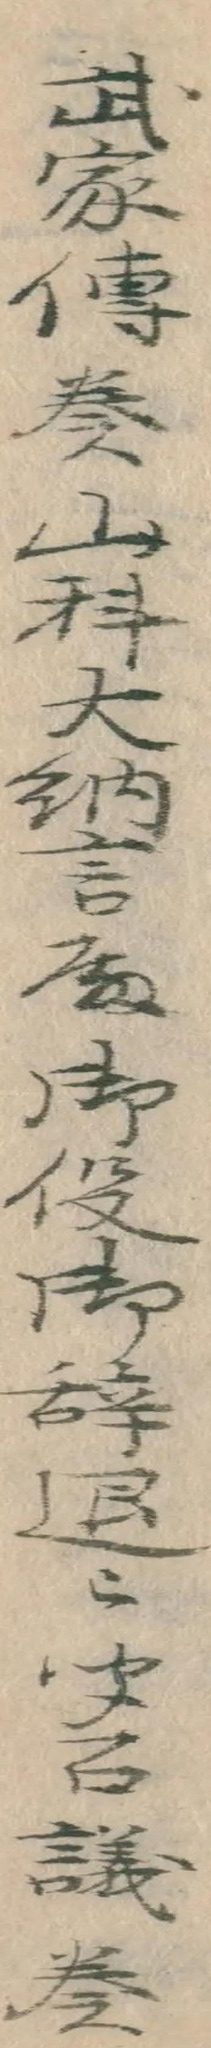武家傳奏山科大納言殿御役御辞退被聞召議奏
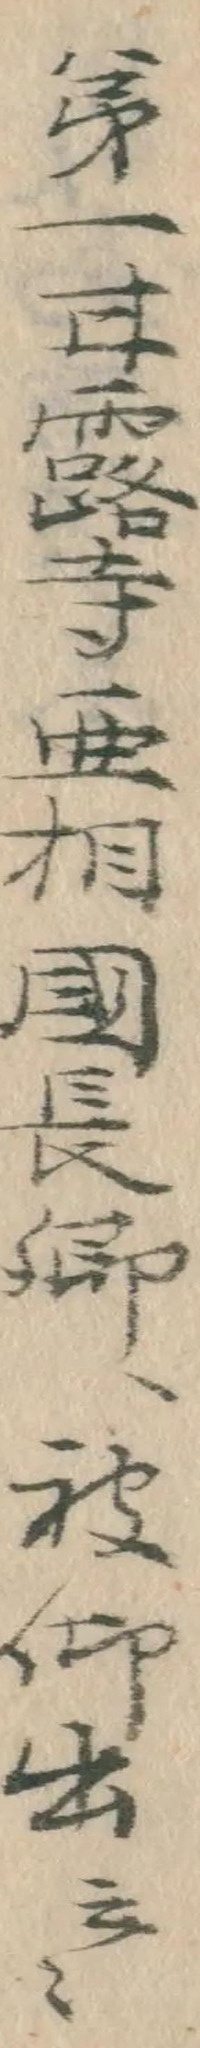第一甘露寺相國長卿被仰出云々
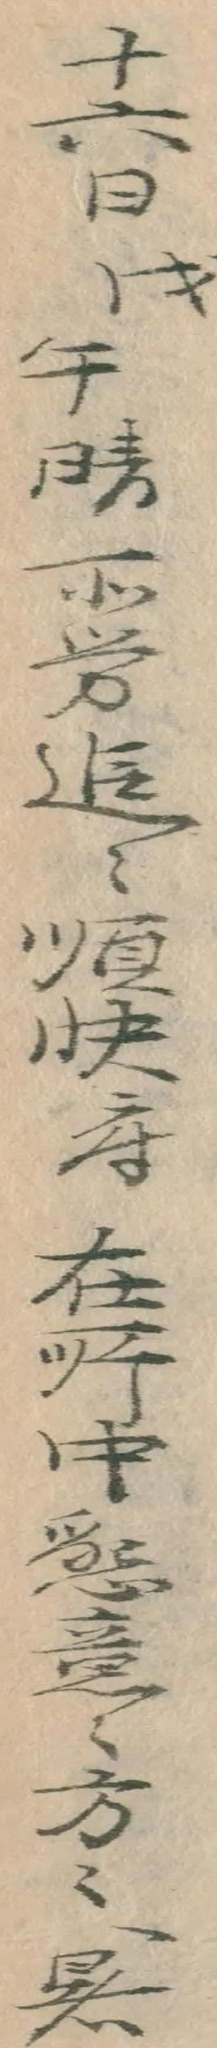十六日戊午晴所労追〻順快ニ付在所中懇意之方々へ暑

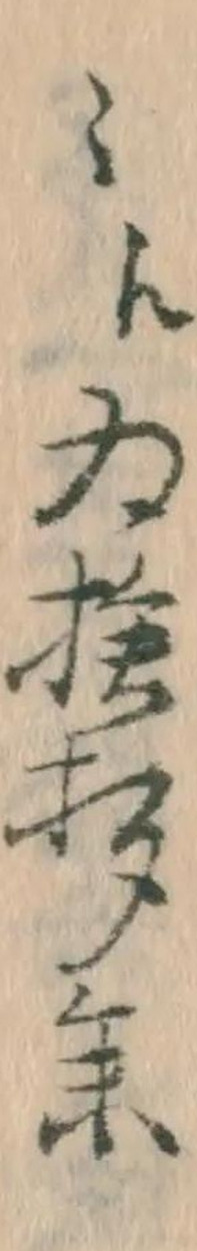〻え為挨拶参
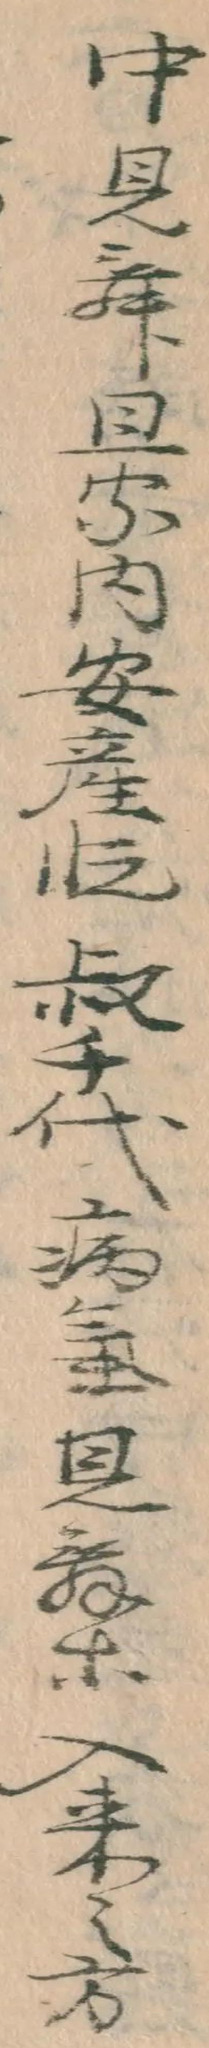中見舞且家内安産段叔千代病氣見舞等入来之方
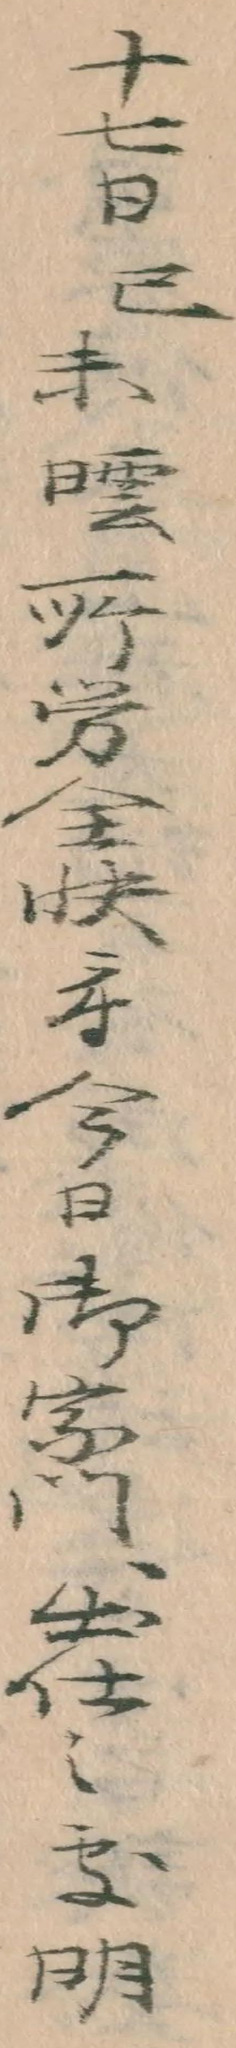十七日己未曇所労全快ニ付今日御家門出仕之處明
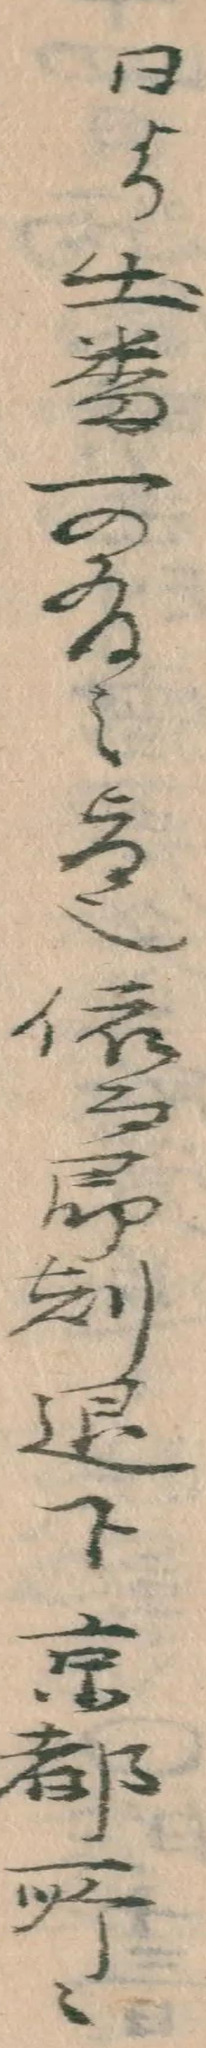日より出番可有之旨也依而即刻退下京都所々
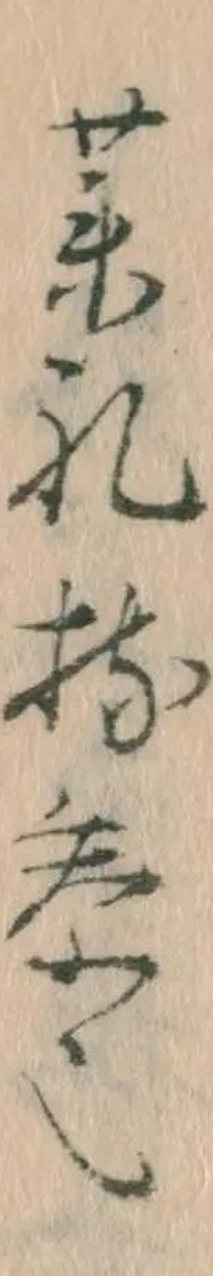薬礼持参也
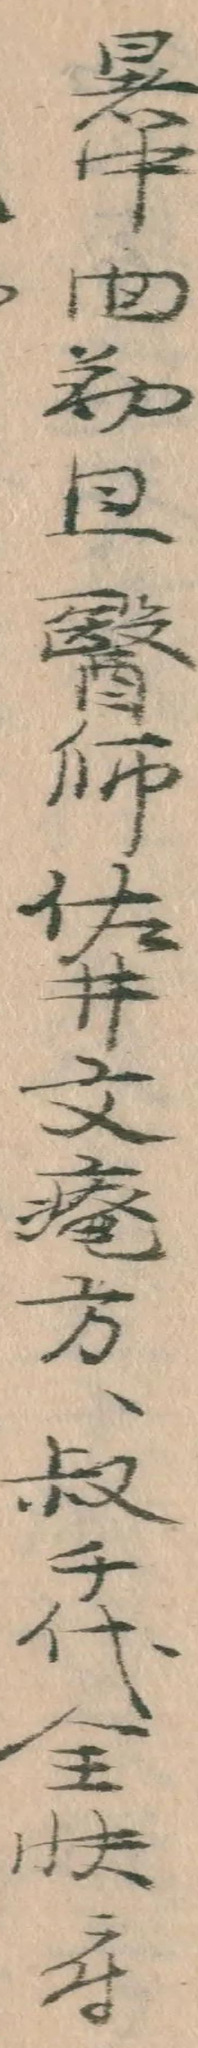暑中回勤且醫師佐井文庵方へ叔千代全快ニ付
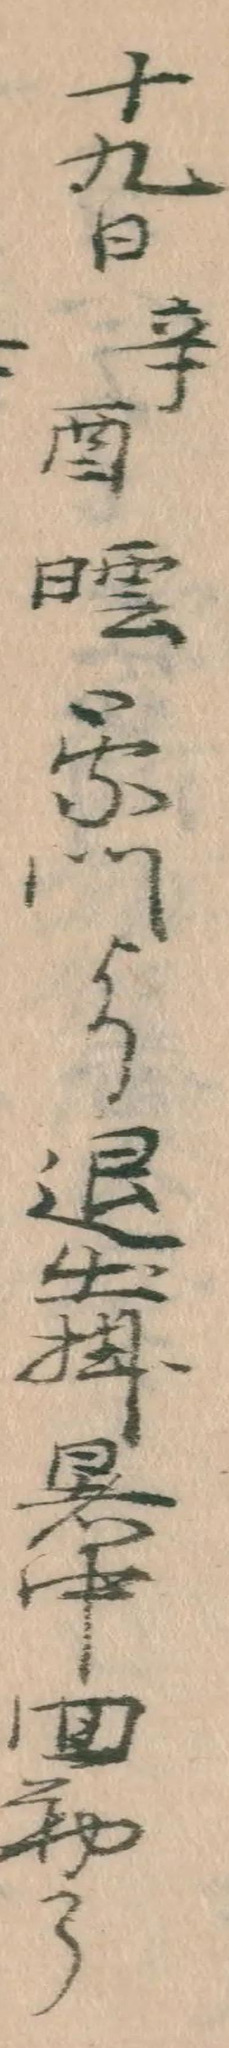十九日辛酉曇御家門より退出掛暑中回勤了
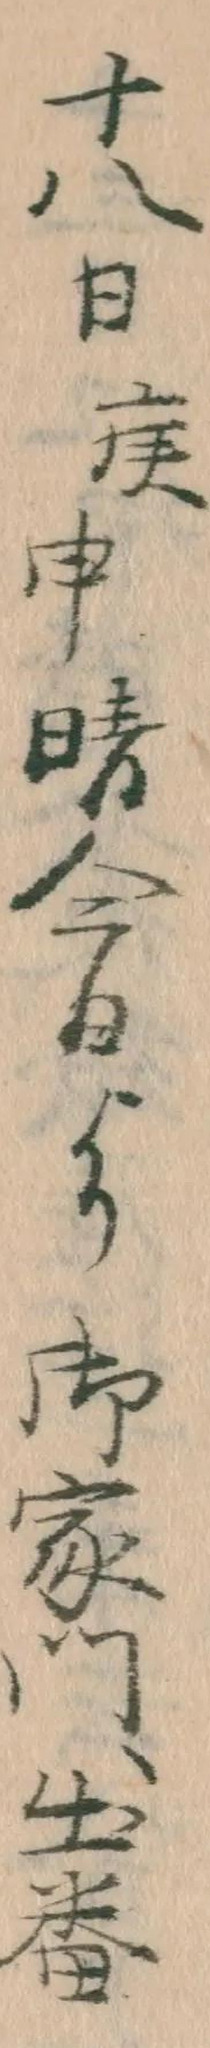十八日庚申晴今日より御家門へ出番
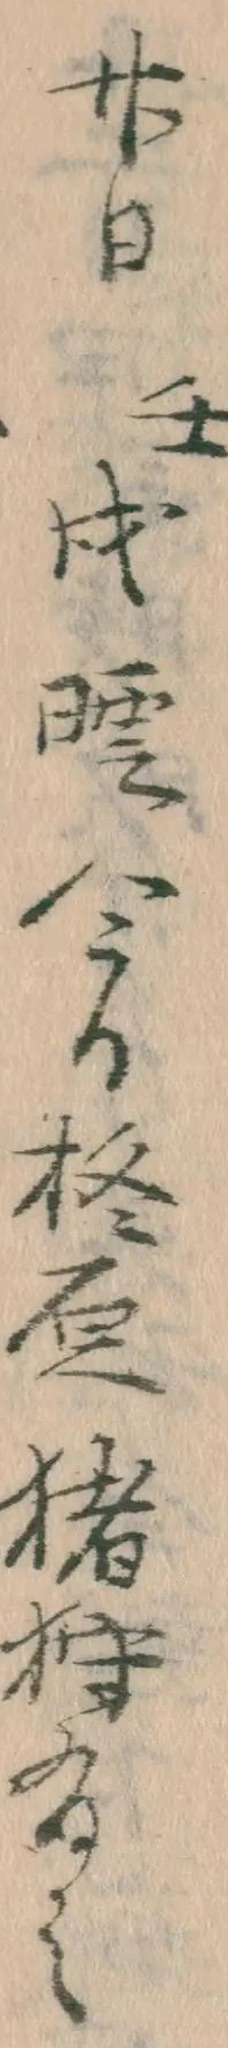廿日壬戌今日柊原猪狩有之
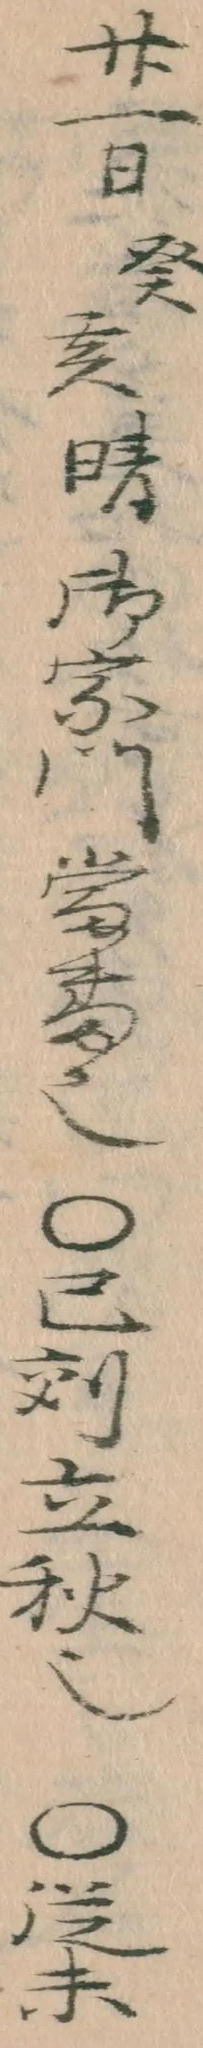廿一日癸亥晴御家門當番也○巳刻立秋也○従未
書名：賀茂社記録. 第63冊
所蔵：国立国会図書館 National Diet Library, JAPAN
